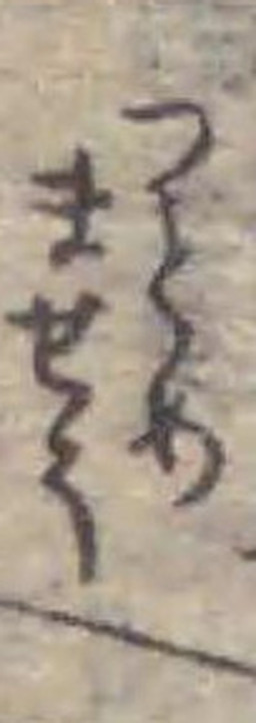ませう
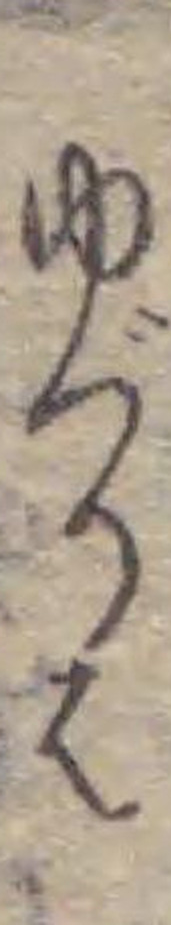ゆづりは
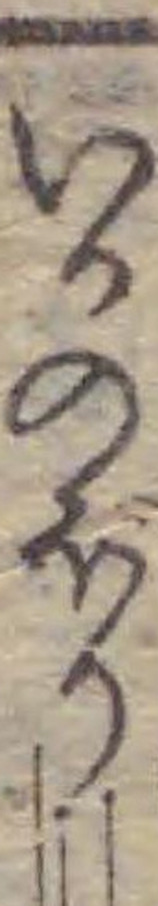いかのほり
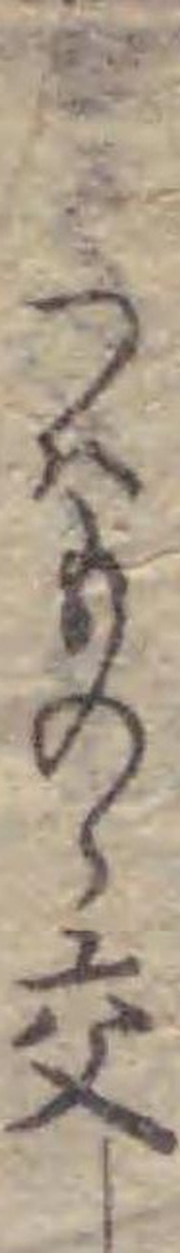つはものゝ交
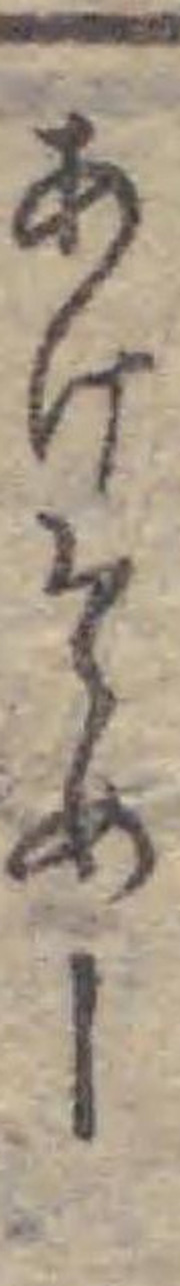あけそめし
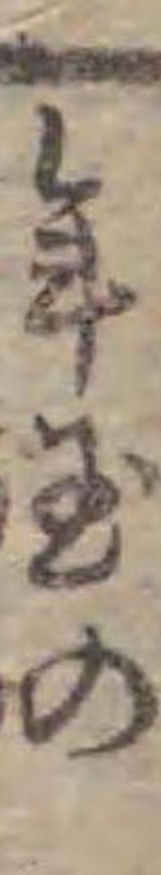年玉の
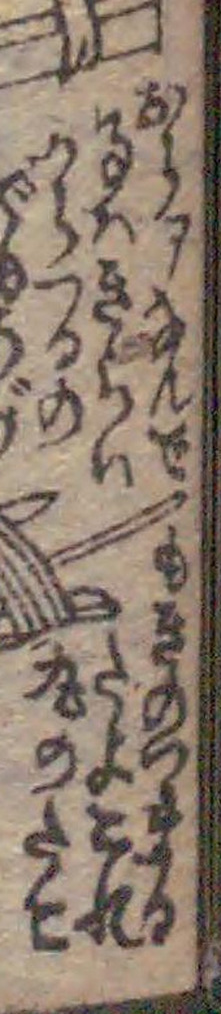からするが
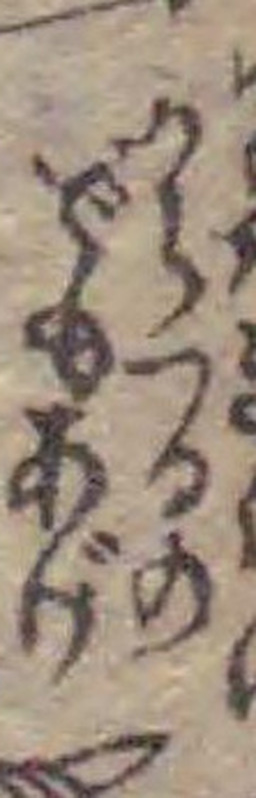でもあげ
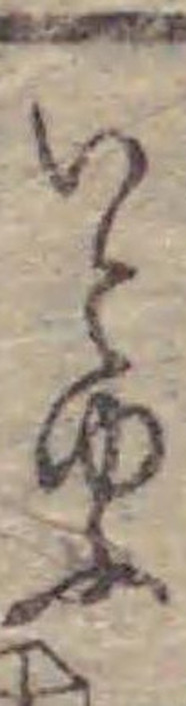いとゆふ
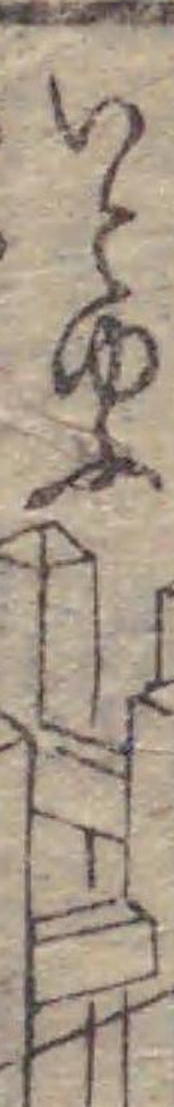いとゆふ
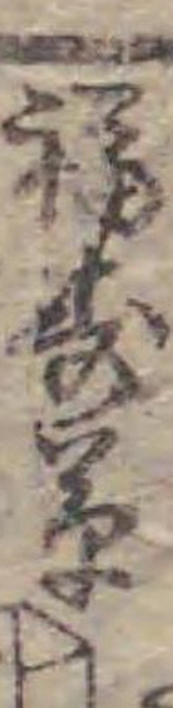福寿草
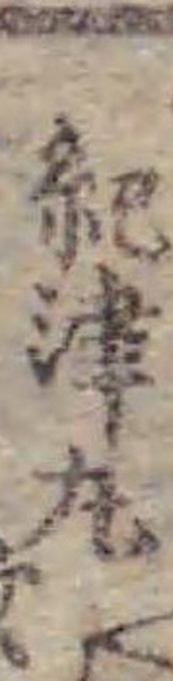紀津丸
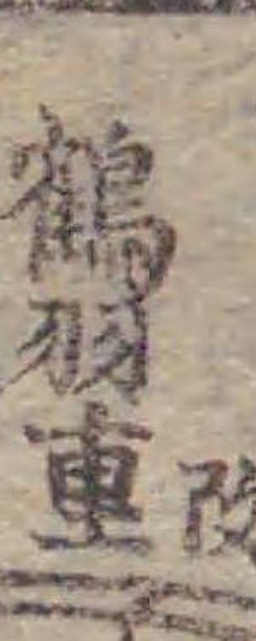鶴羽重
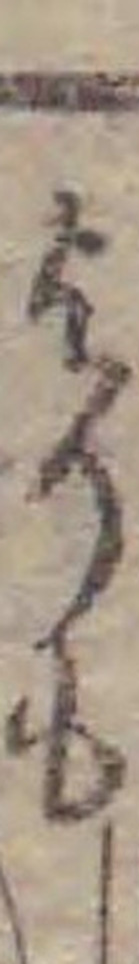よりも
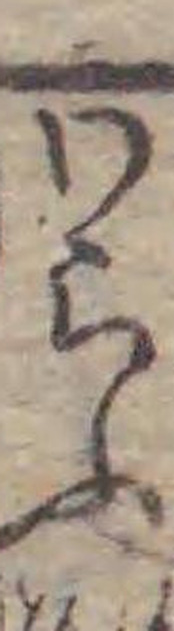わらふ
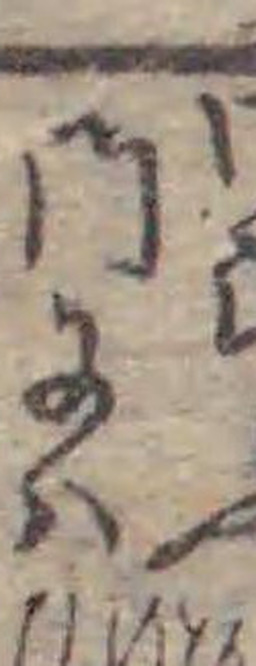門には
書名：年始御礼帳 : 3巻
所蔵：国立国会図書館 National Diet Library, JAPAN
